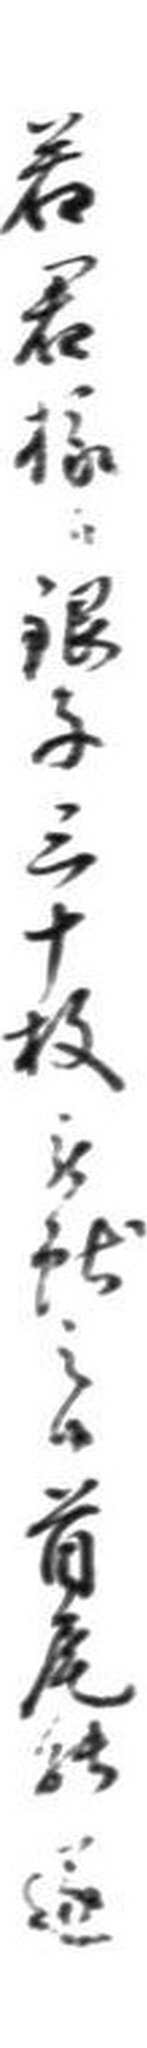若君様江銀子三十枚被献之候首尾能遂

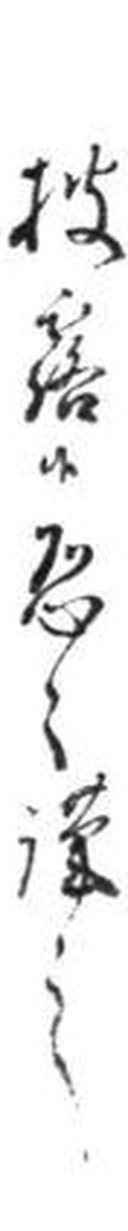披露候恐々謹言
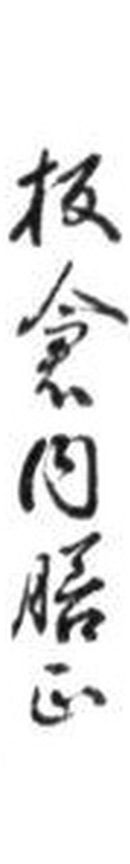板倉内膳正
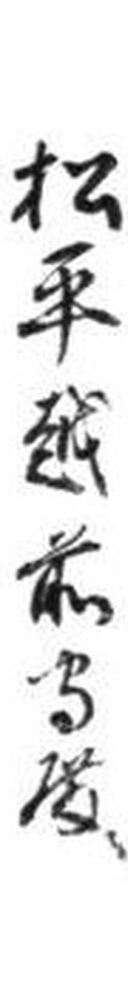松平越前守殿
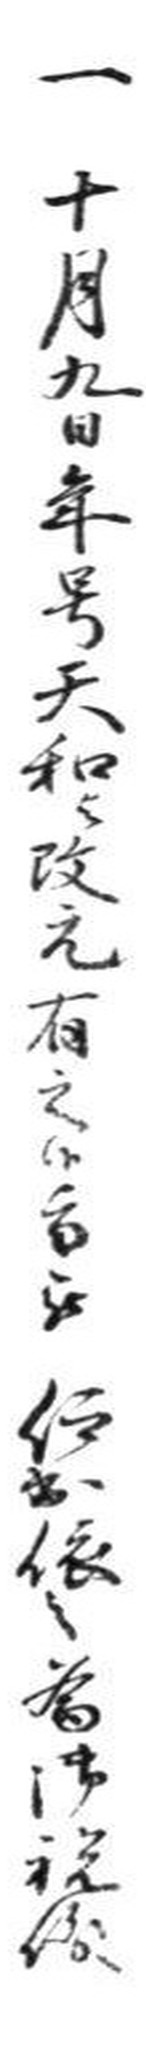一十月九日年号天和と改元有之候旨被仰出依之為御祝儀
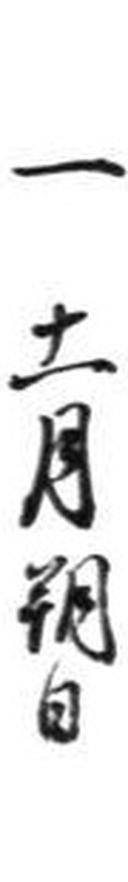一十一月朔日
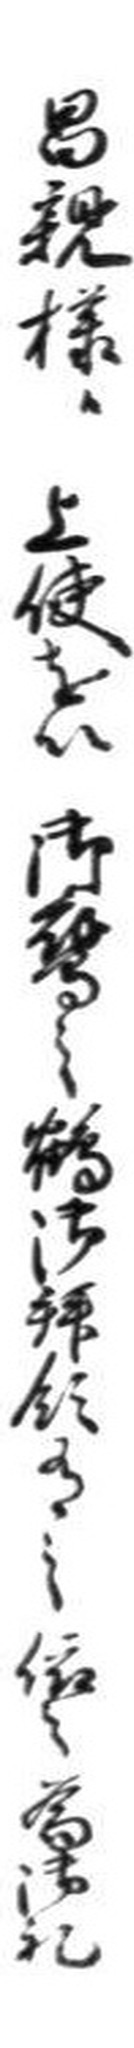昌親様江上使を以御鷹之鶴御拝領有之依之為御礼
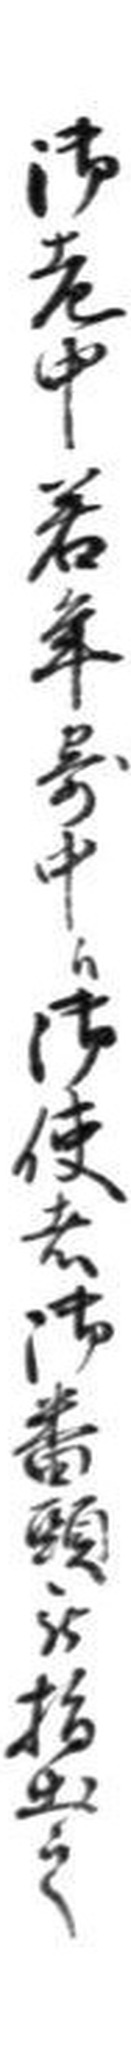御老中若年寄中江御使者御番頭被指出之
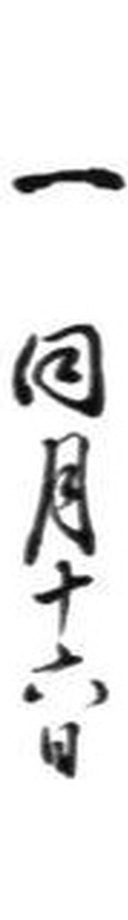一同月十六日
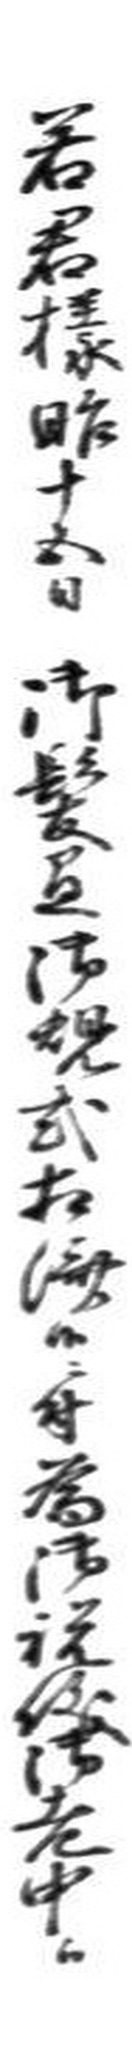若君様昨十五日御髪置御規式相済候ニ付為御祝儀御老中江
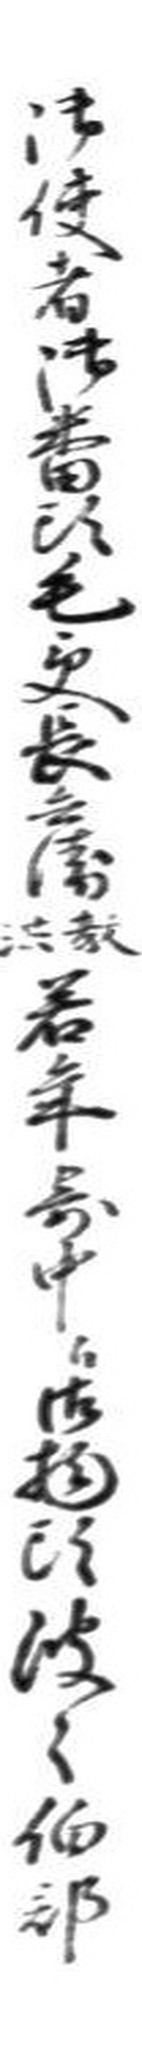御使者御番頭毛受長兵衛教洪若年寄中江御物頭波々伯部
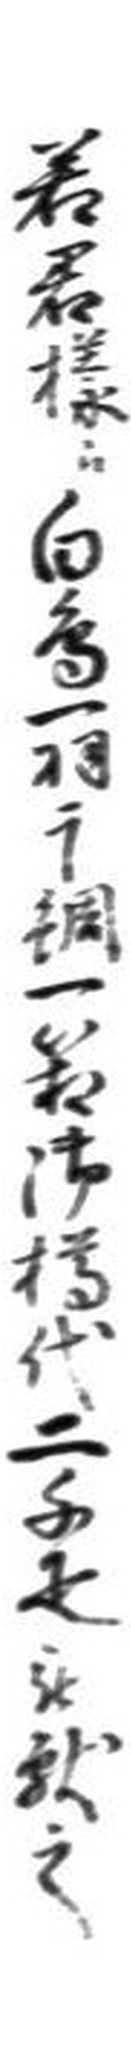若君様江白鳥一羽干鯛一箱御樽代二千疋被献之
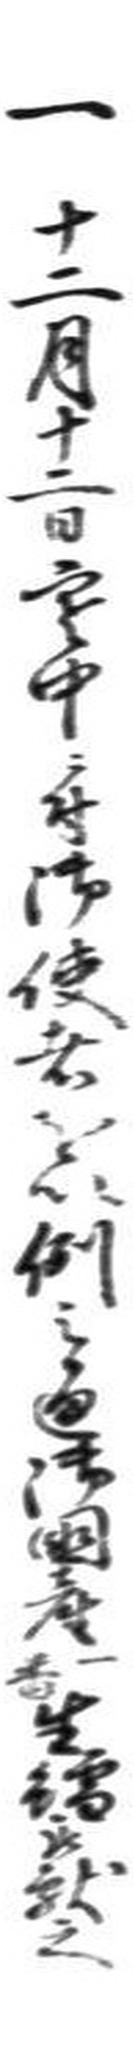一十二月十二日寒中ニ付御使者を以例之通御国産一番生鱈被献之
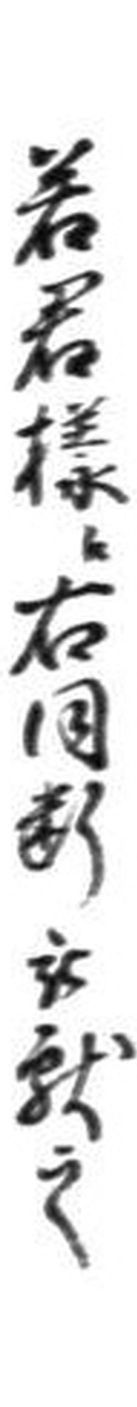若君様江右同断被献之

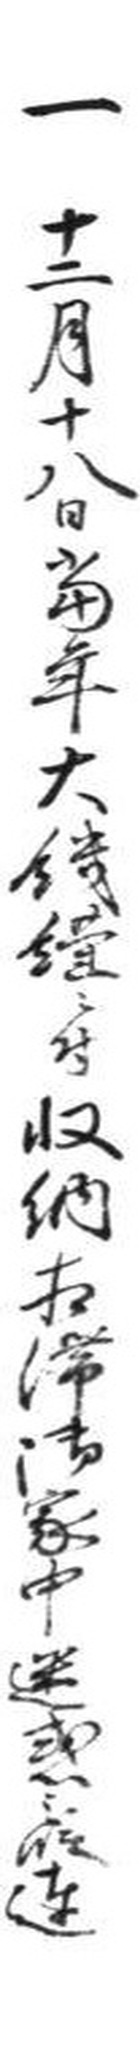一十二月十八日当年大飢饉ニ付収納相滞御家中迷惑之段達
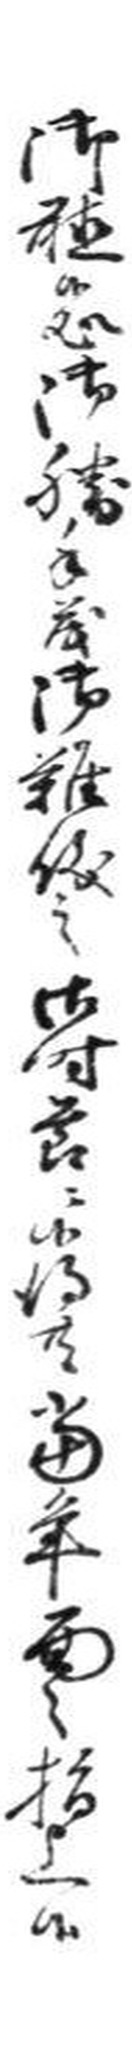御聴候処御勝手も御難儀之御時節ニ候得共当年面々指上候
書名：家譜 十五 綱昌公 従天和元年到元禄十二年
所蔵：福井県文書館 Fukui Prefectural Archives
